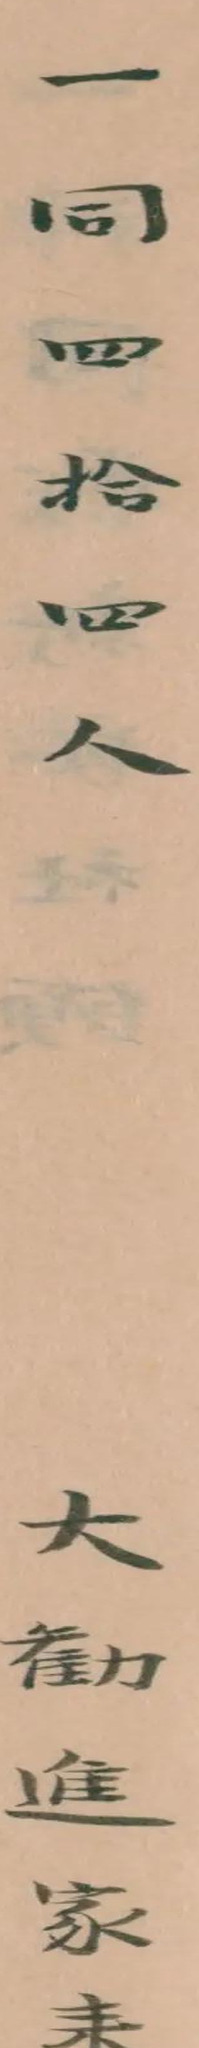一同四拾四人大勧進家来
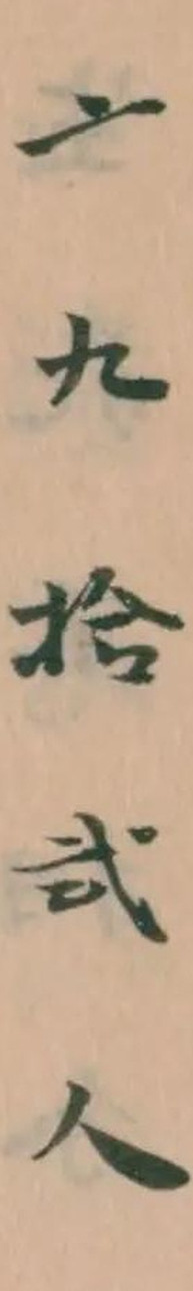〆九拾弐人
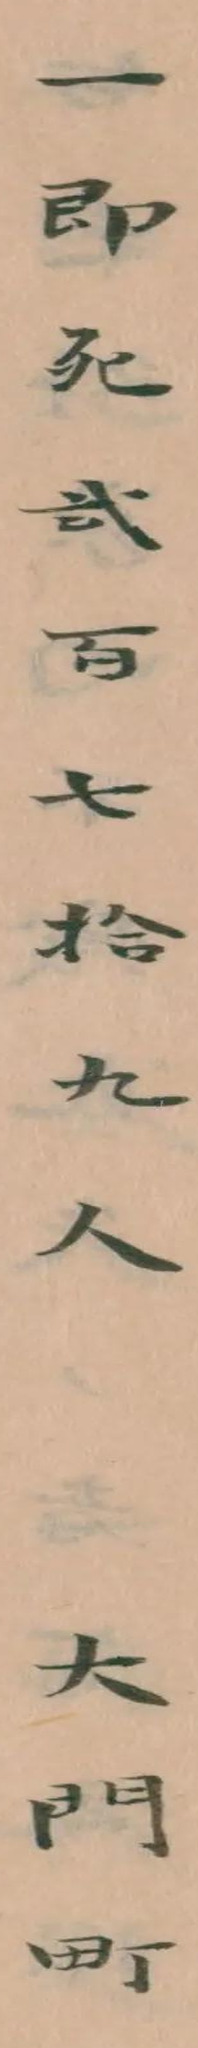一即死弐百七拾九人大門町
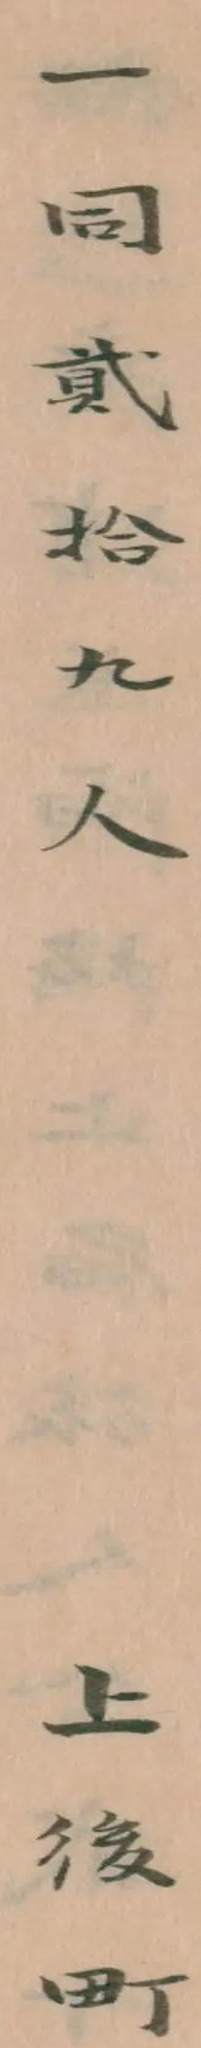一同貮拾九人上後町
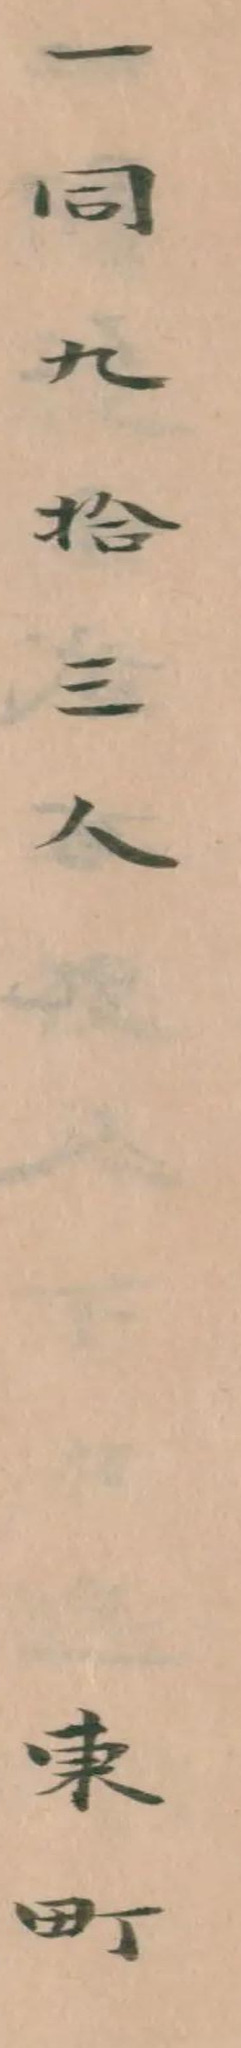一同九拾三人東町
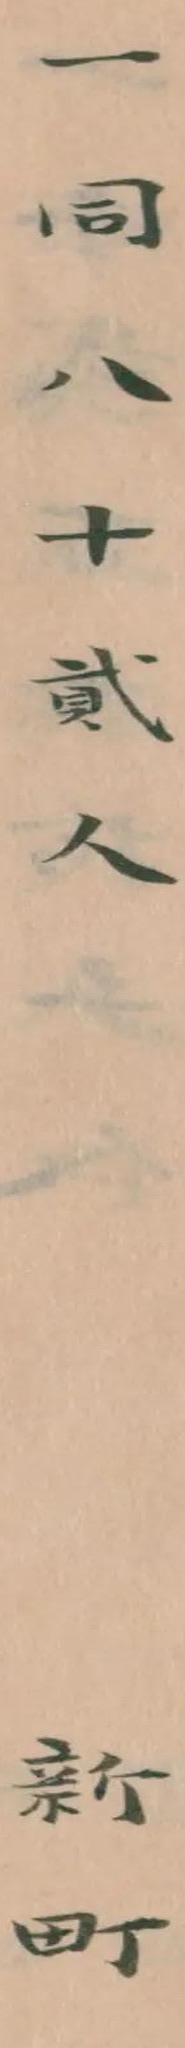一同八十貮人新町
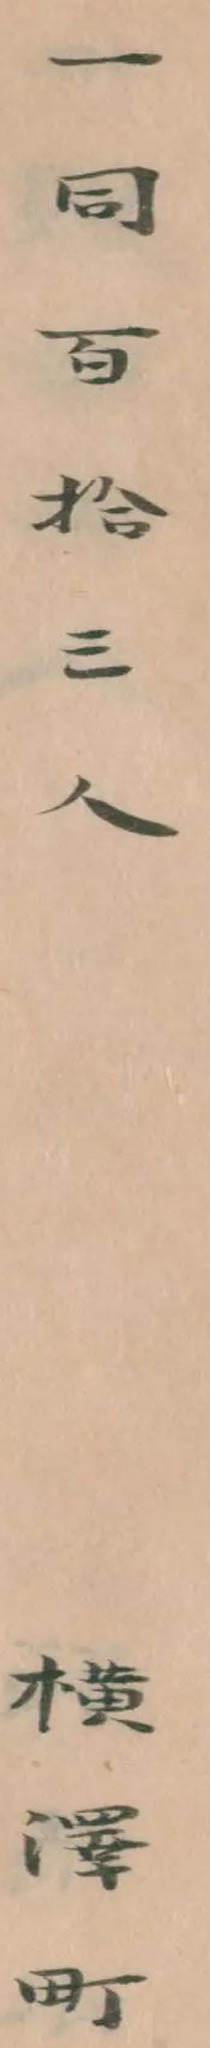一同百拾三人横沢町
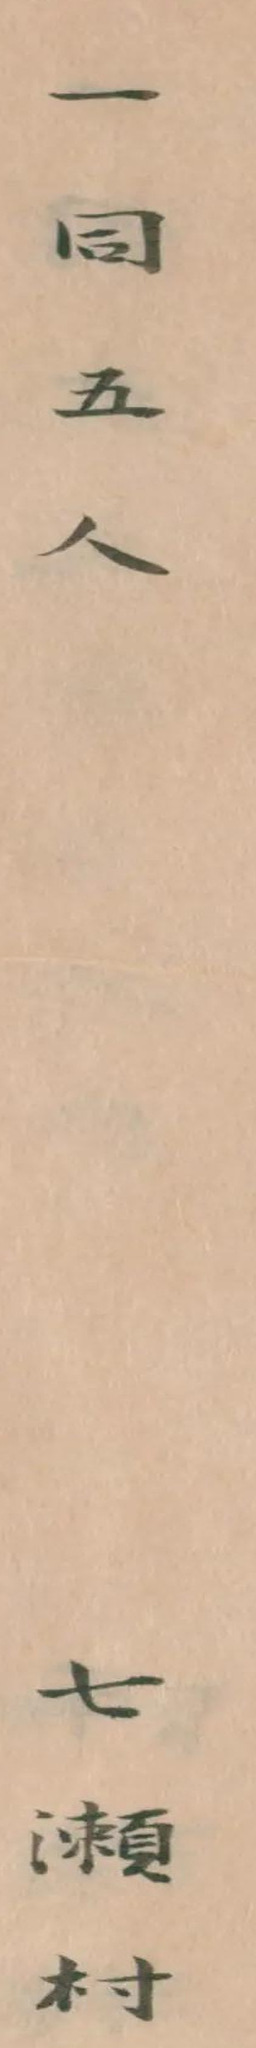一同五人七瀬村
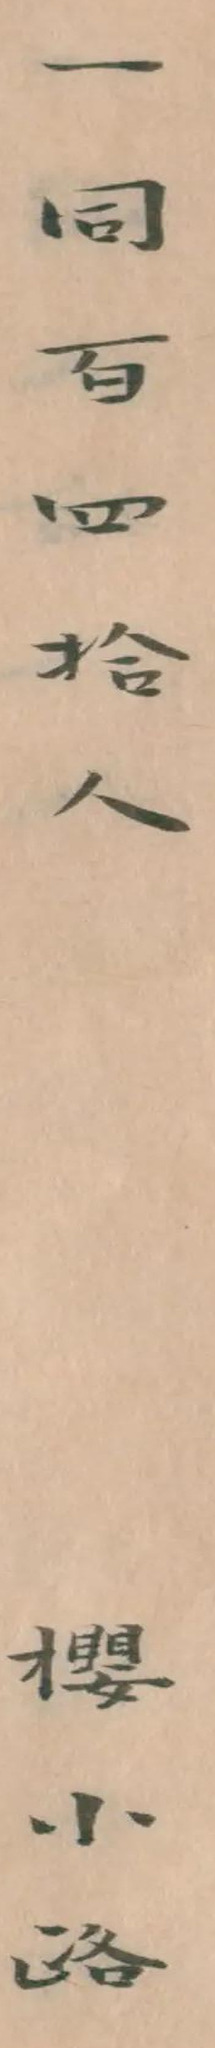一同百四拾人桜小路
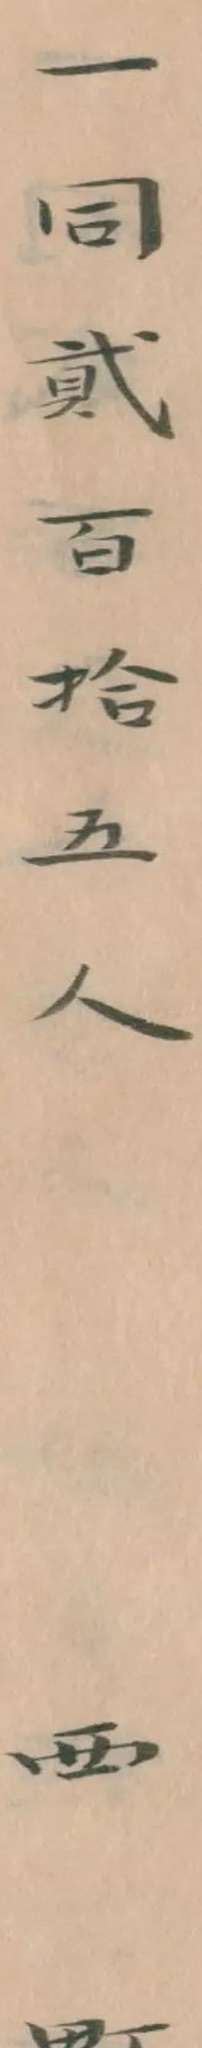一同貮百拾五人西町

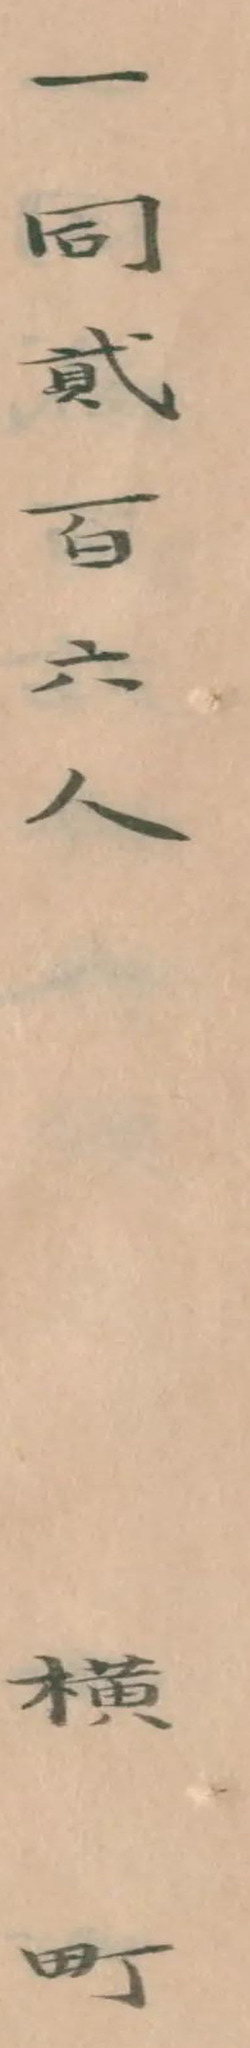一同貮百六人横町
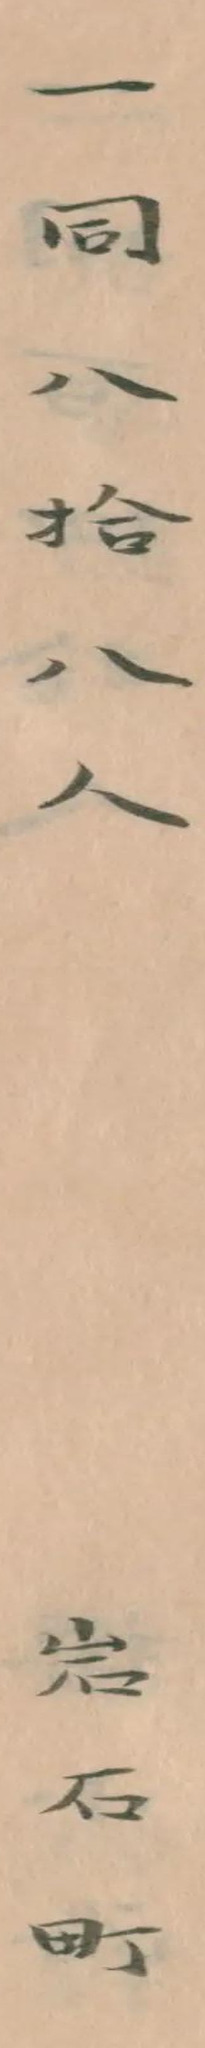一同八拾八人岩石町
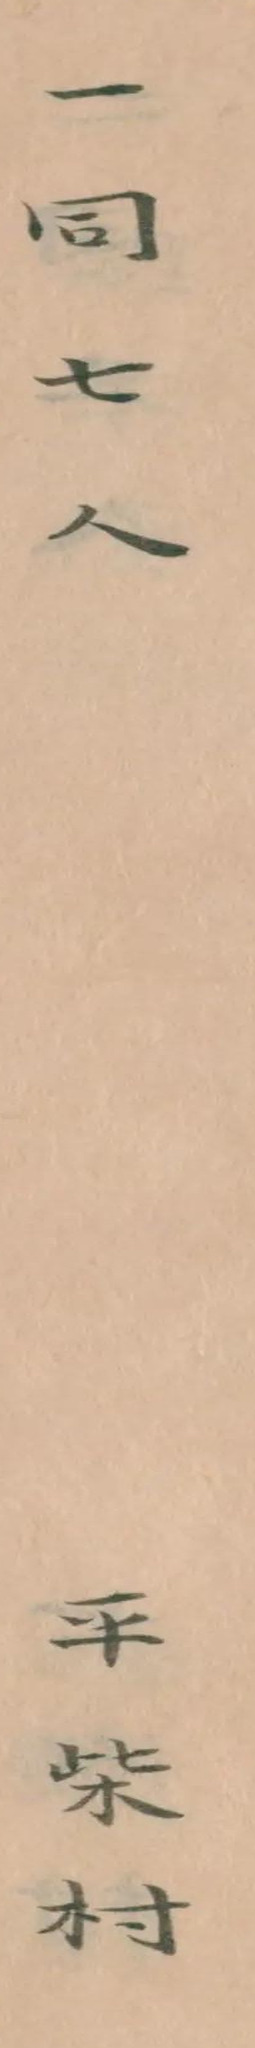一同七人平柴村
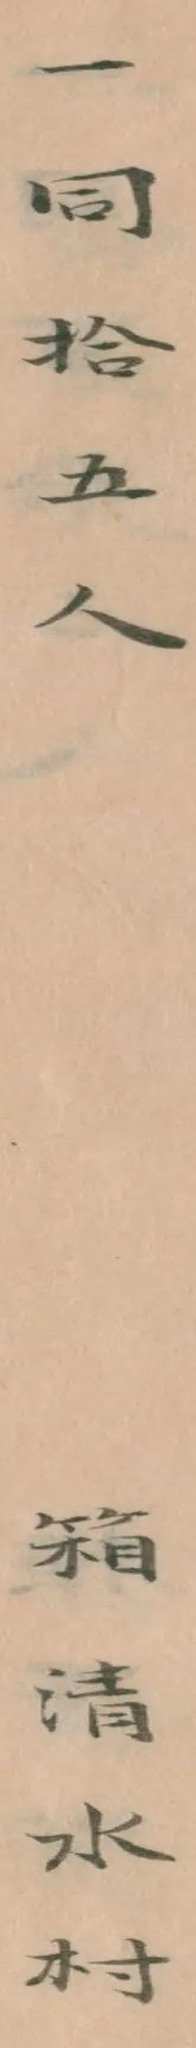一同拾五人箱清水村
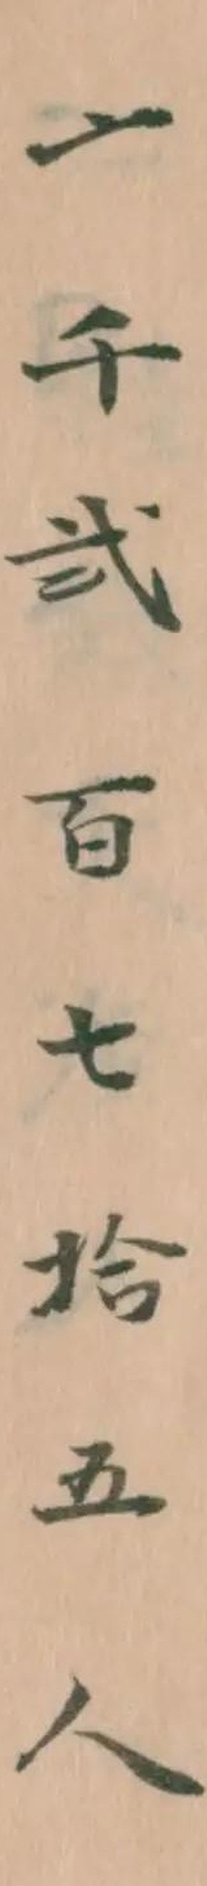〆千弐百七拾五人
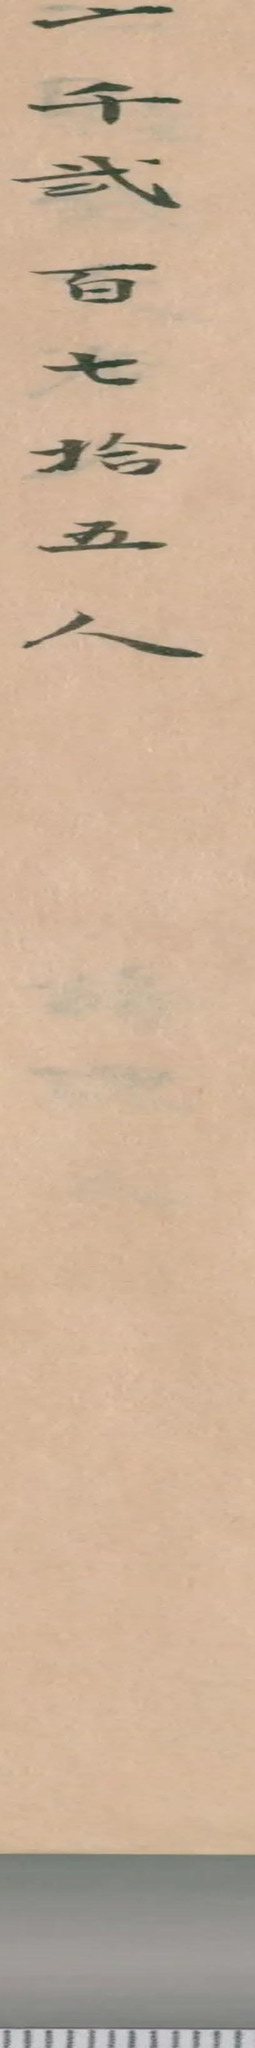〆千弐百七拾五人
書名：地災撮要. 巻5-6(地震之部)
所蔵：国立国会図書館 National Diet Library, JAPAN
